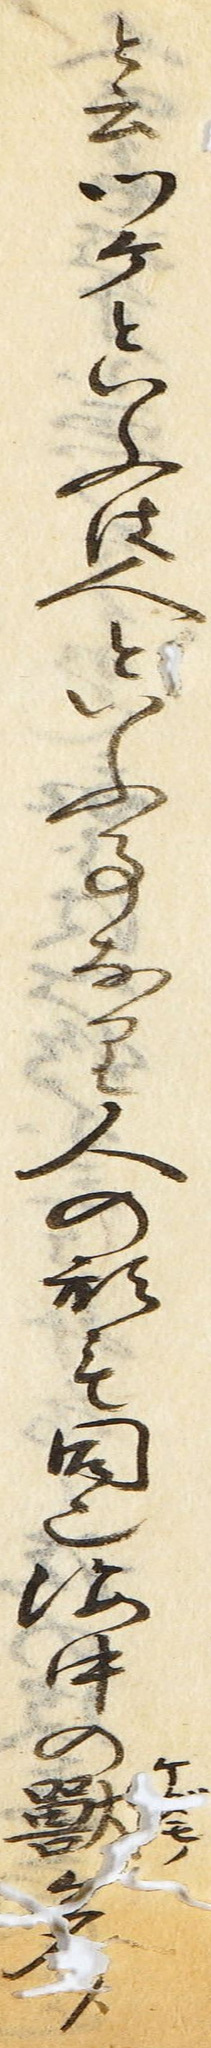と云ツケといふは人といふ事なり人の形も同也海中の獣多
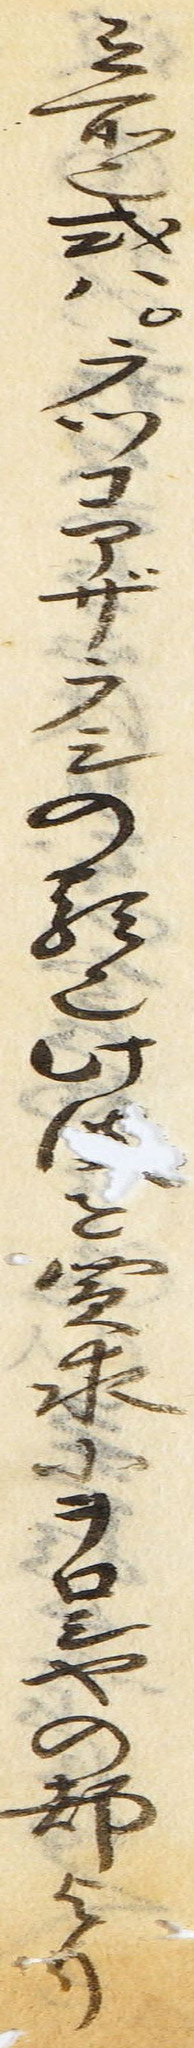有所也或は゜ラツコアザラシの類也此皮を買求にヲロシヤの都より
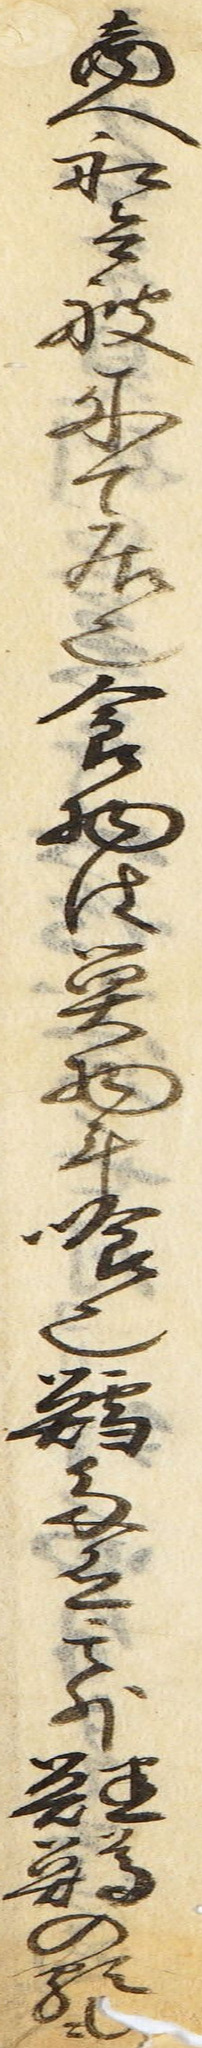商人船壱艘来て居也食物は魚物計喰也鱈多有其外鮭鱒の類も

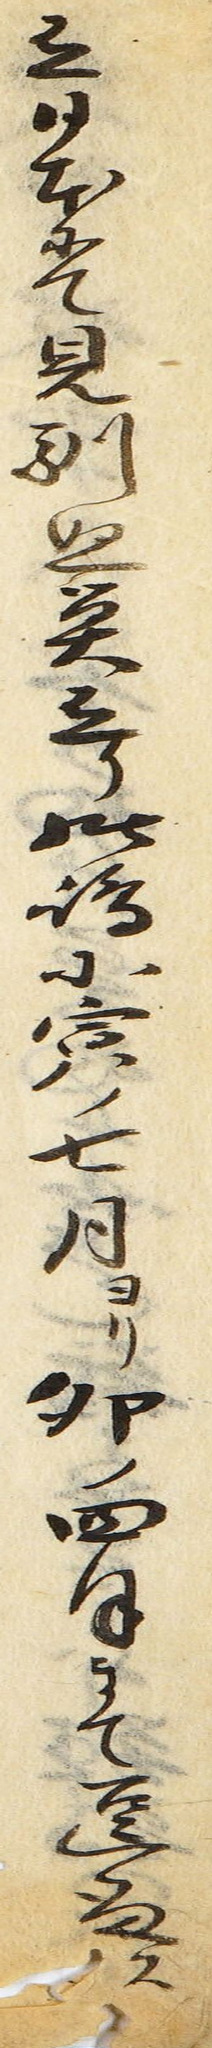有日本にて見馴ぬ魚有り此嶋に寅ノ七月より卯ノ四月まて逗留す
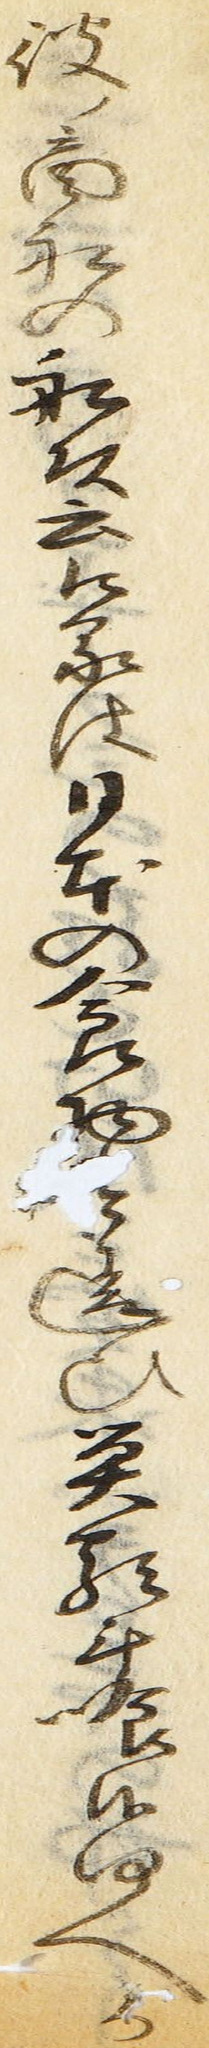彼ノ商船の船頭云けるはに日本の食物と違ひ魚類計喰候ゆへか
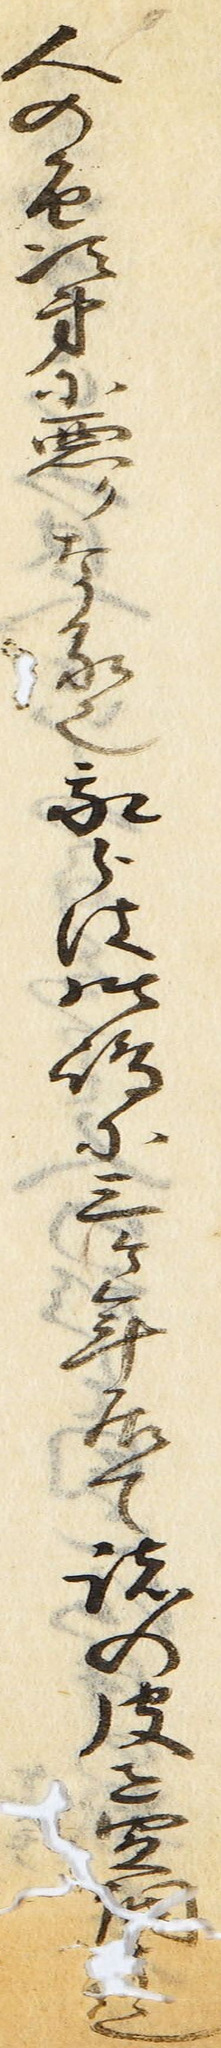人の色次第に悪くなる也我らは此嶋に三ヶ年居て諸の皮を買調也
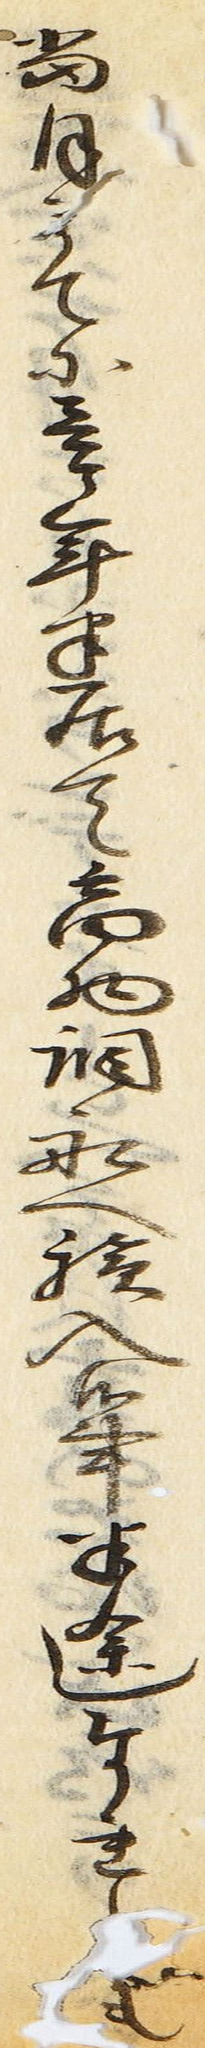当月まてに壱ヶ年半居て商物調船へ積入候事半途なれしも
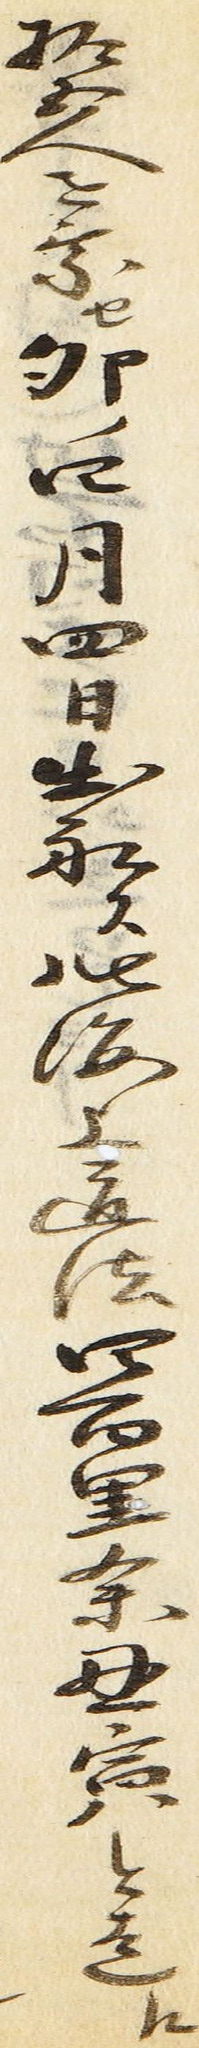壱五人を乗せ卯ノ四月出船す此海上道法四百里余丑寅と走る
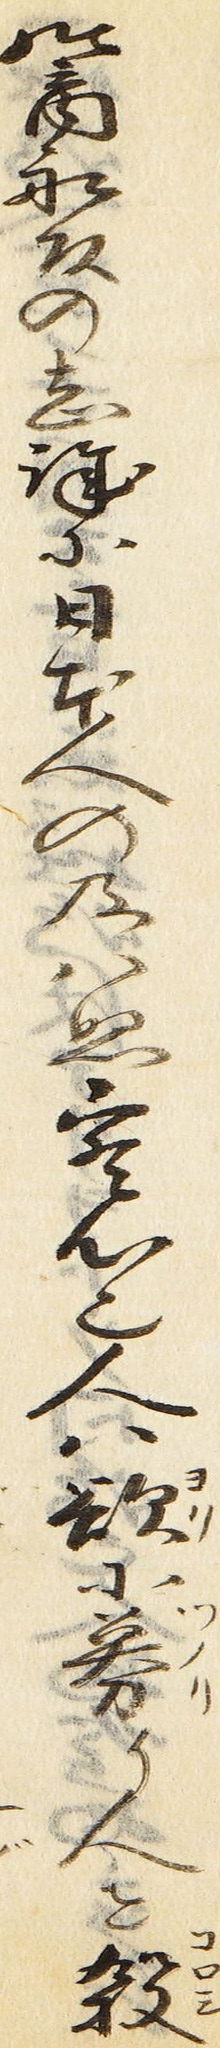此商船頭志誠に日本人の及はぬ寒心也人は欲に募り人を殺
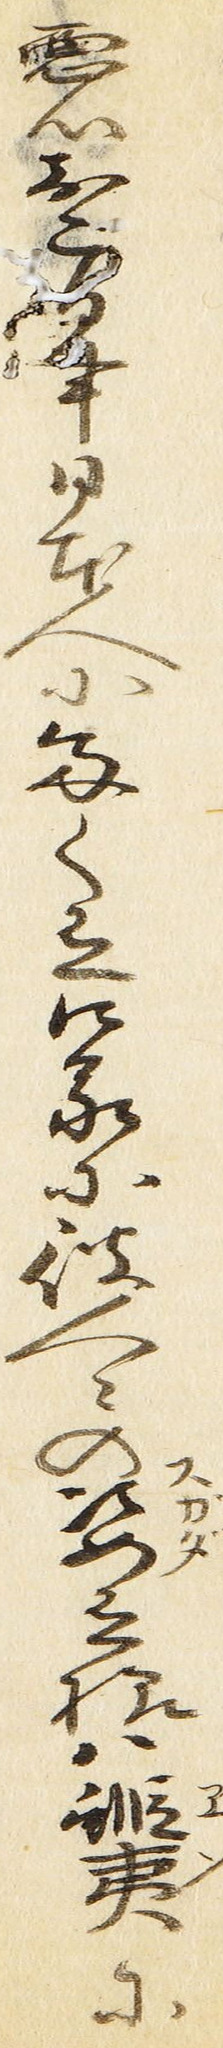悪心おこる事日本人に多く有けるに彼人々の姿有様は蝦夷に
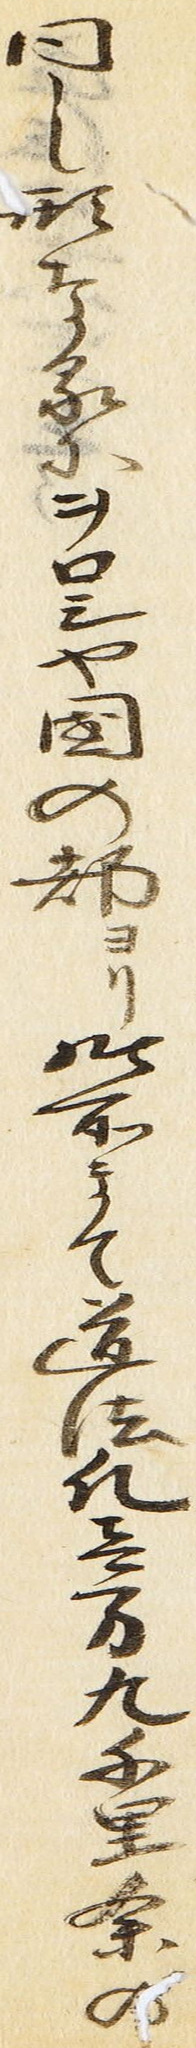同し形なるにヲロシヤ国の都より此所まて道法凡壱万九千里余の
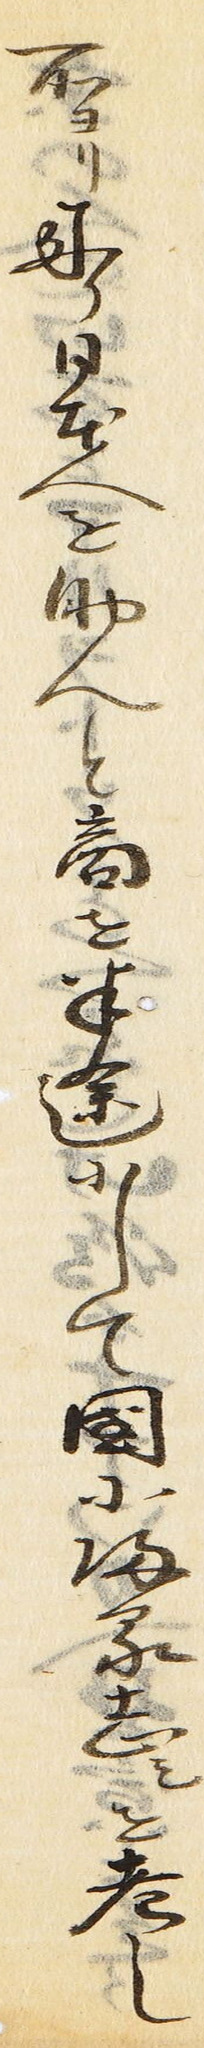所より来り日本人を助んと商を半途にして国に帰る志しを老し
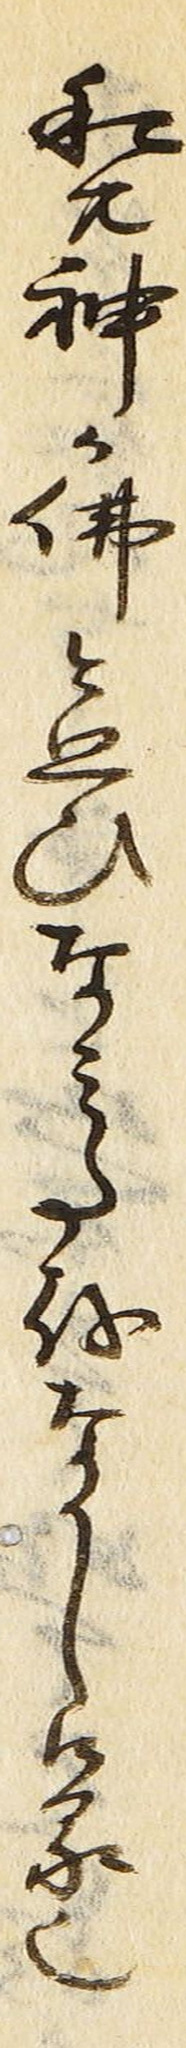私共神か仏と思ひなみたをなかしける也
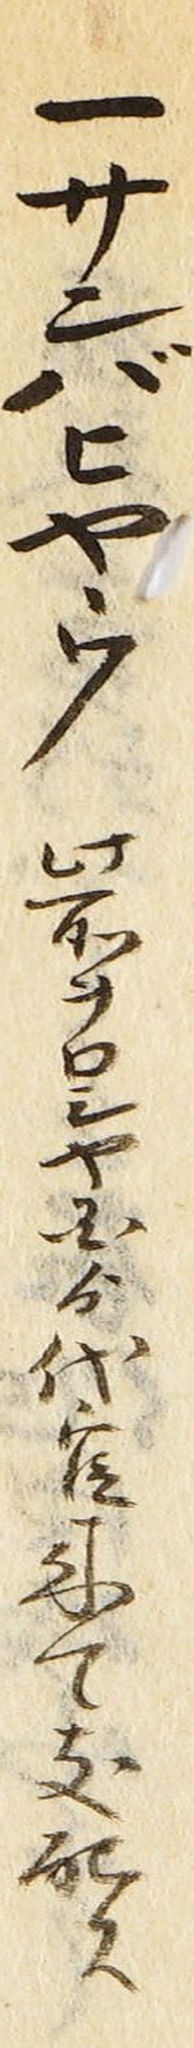一サンバヒヤウ此所ヲロシヤ国ゟ代官来て支配す
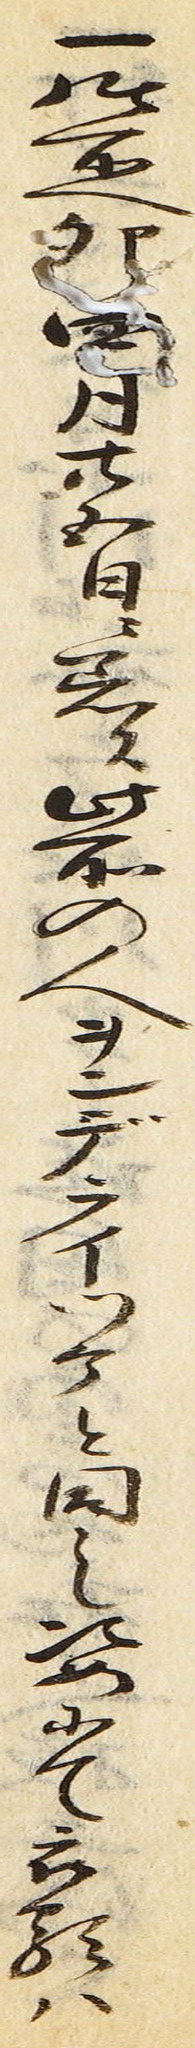一此所へ卯四月五日に着ㇲ此所の人ヲンデライツケと同し姿にて衣類は
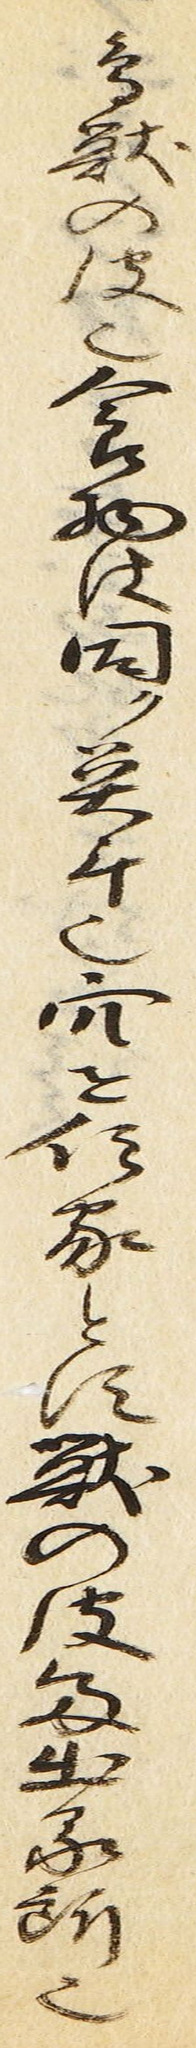鳥獣の皮也食物は同く魚計也穴を住家とす獣の皮多出る所也
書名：外国漂流記
